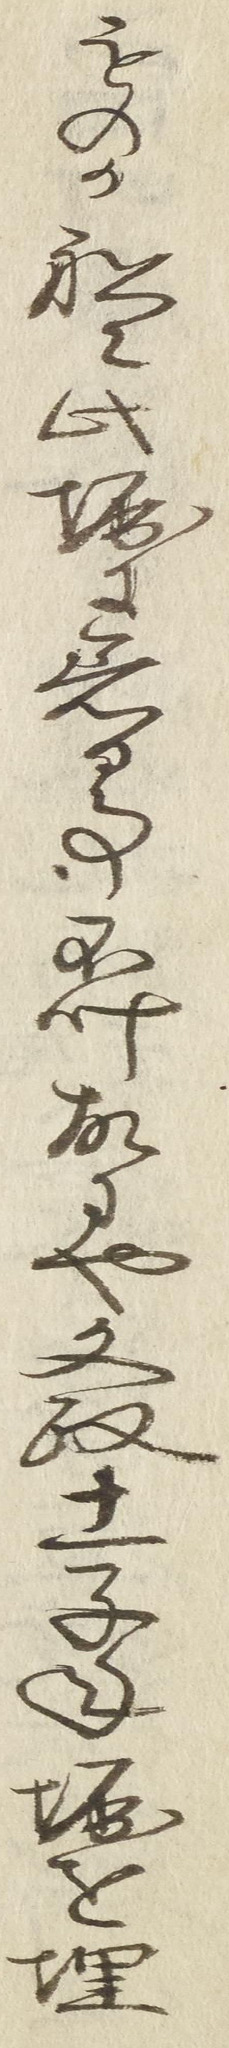ものか船に此堀に着る事不叶故にや文政十一子年堀を埋
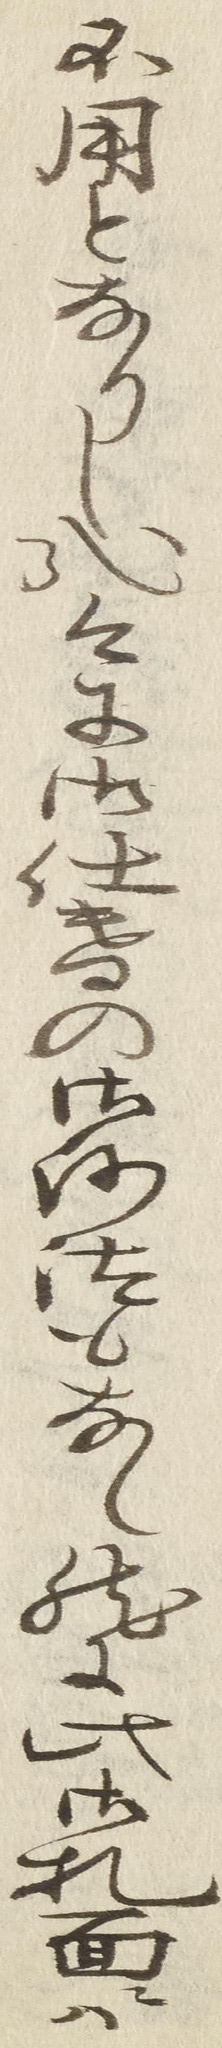不用となりし哉今に御仕替の御沙汰もなし然に此御札面には
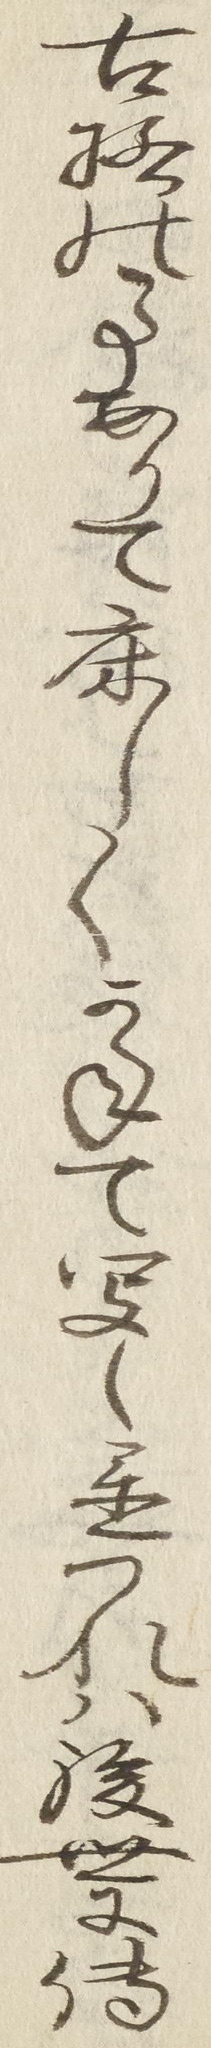古格の事ありて床しくかねて写し置つれは後世に伝
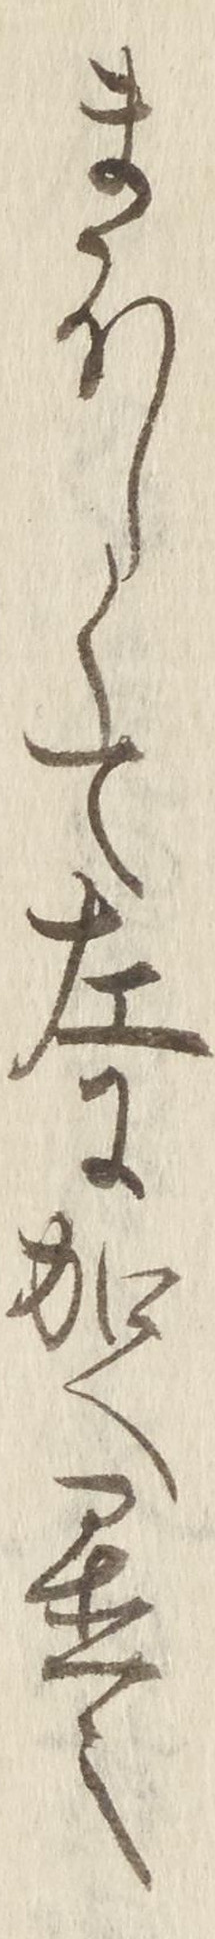まほしくて左に加へ置也
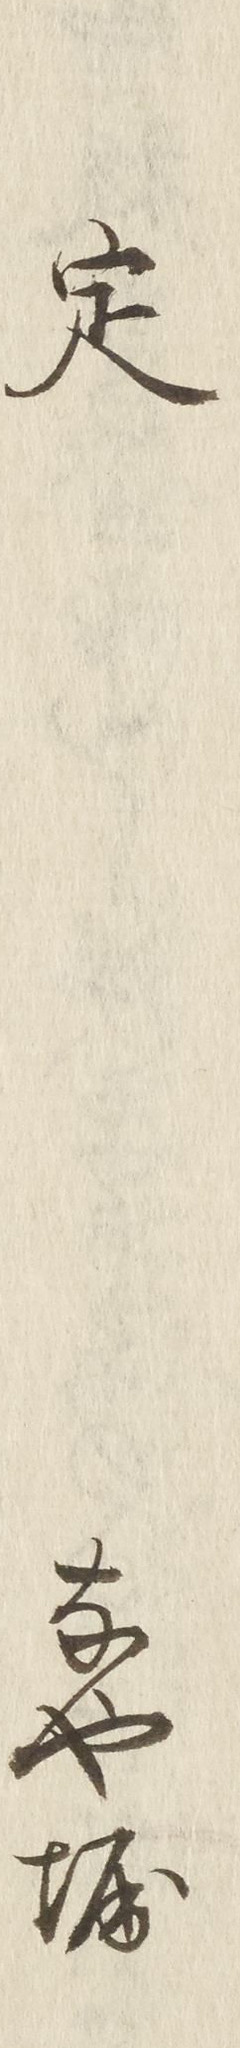定なや堀
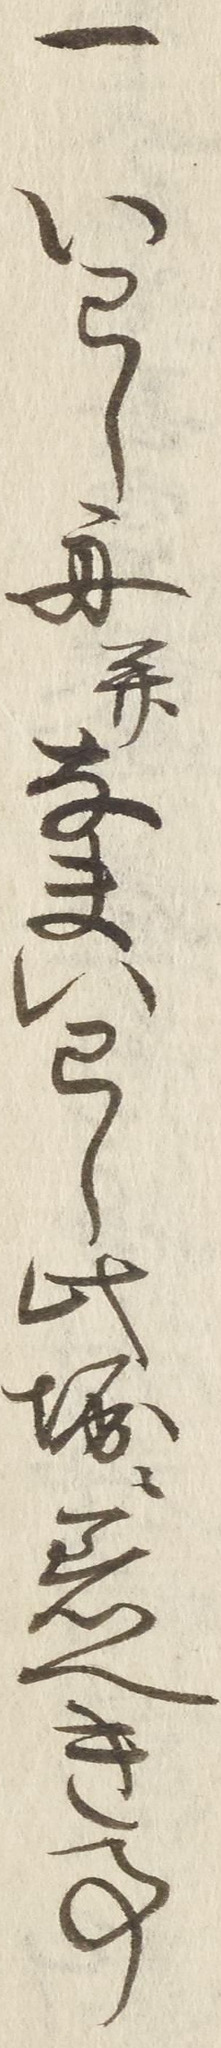一いわし舟幷なまいわし此堀に着へき事
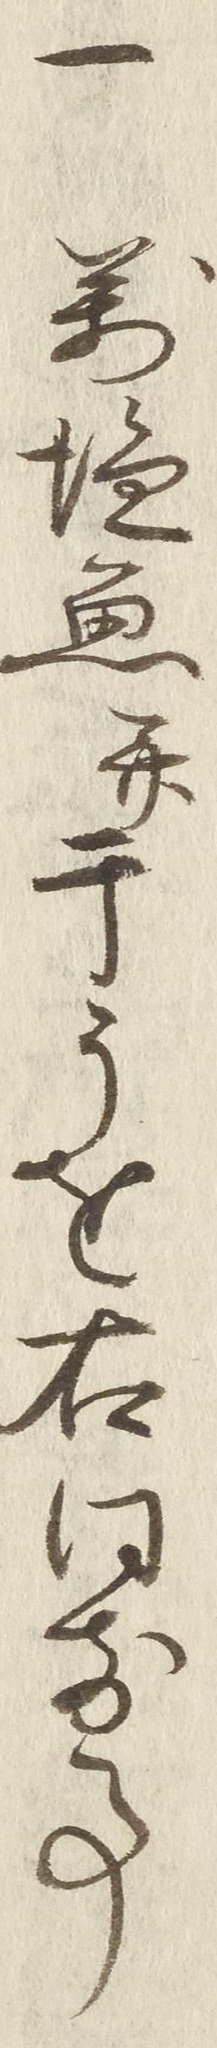一万塩魚幷干うを右同前事
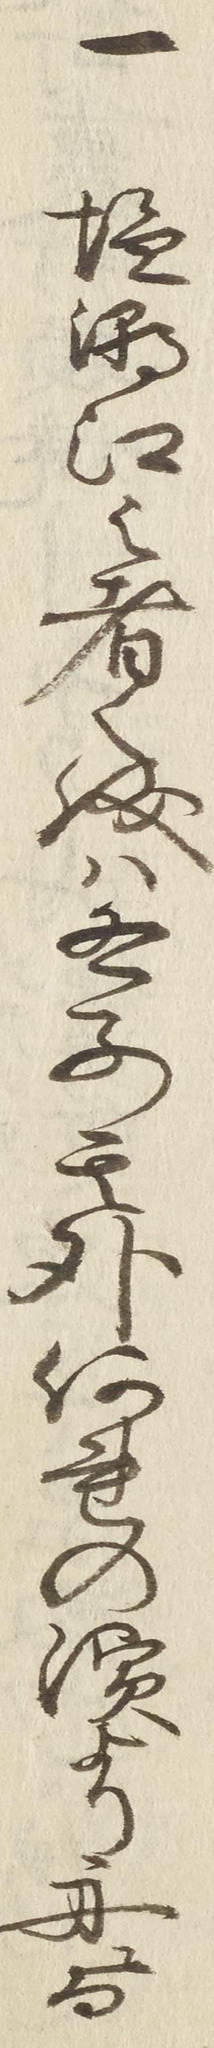一塩潮江の者の儀ハ各子其外何れの濱より舟にて
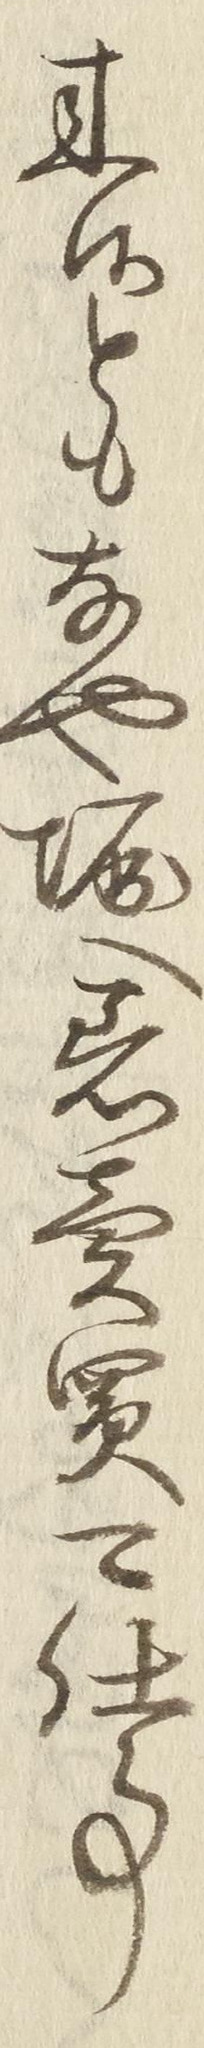来候ともなや堀へ着売買可仕事
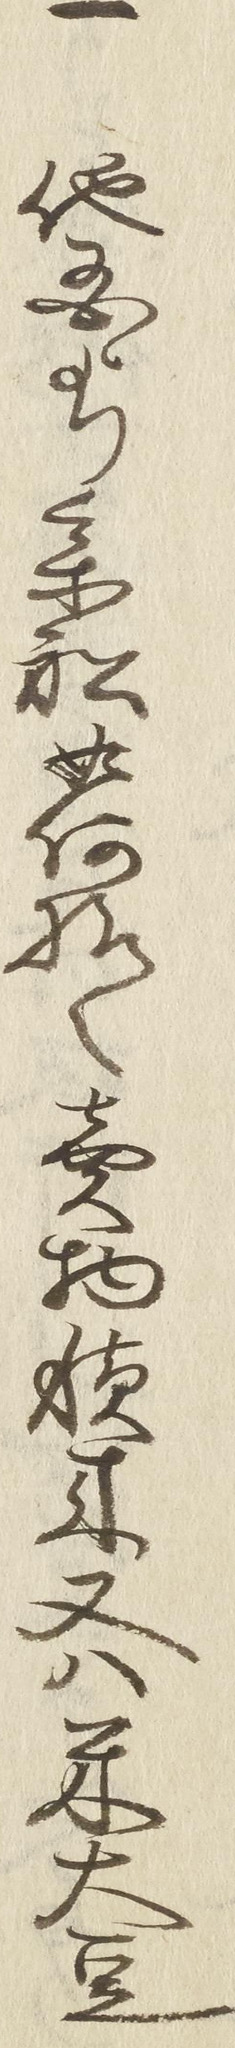一他国より乗船如何様の売物積来又ハ米大豆
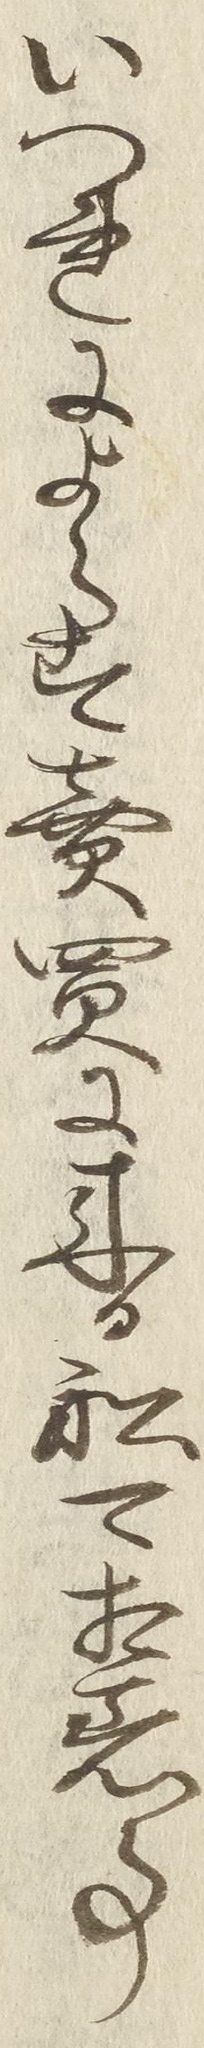いつれによらす売買に来る船可相着事
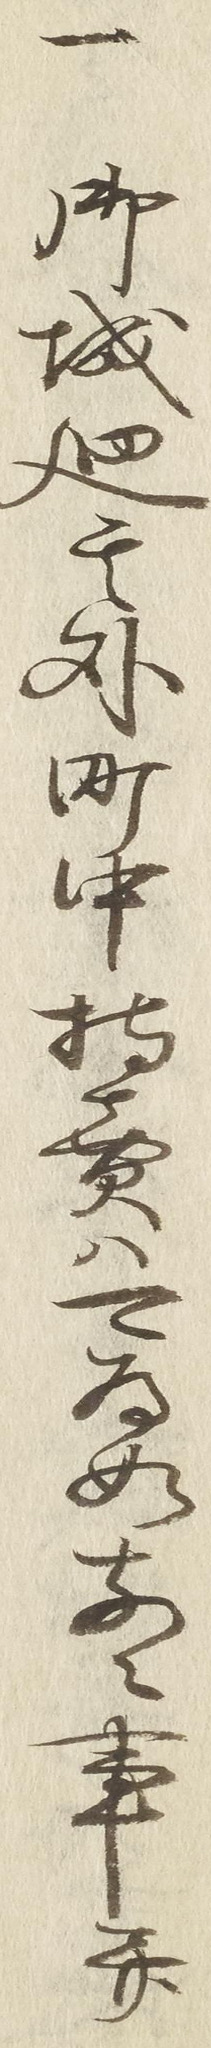一御城廻其外町中持売ハ可為如前々事幷
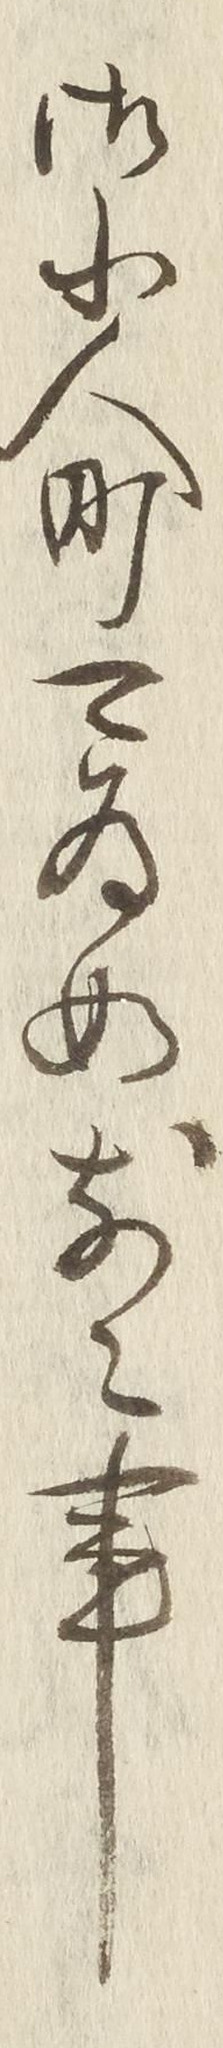御小人町可為如前々事
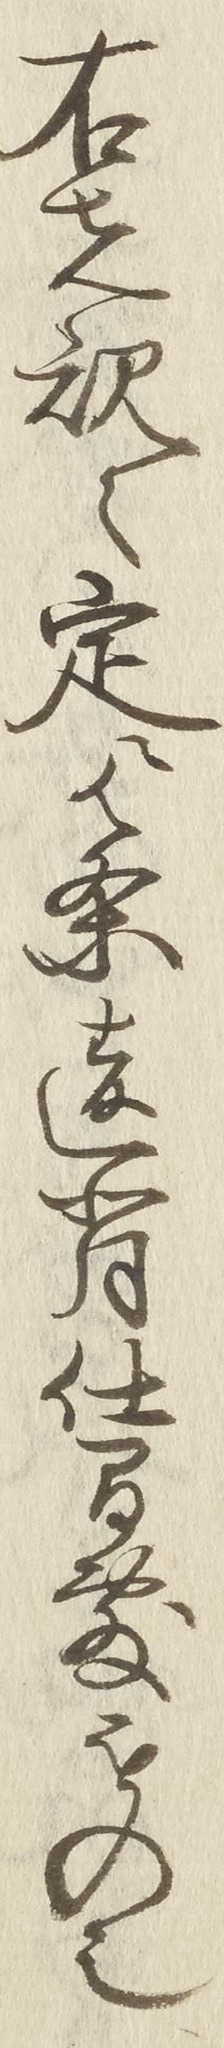右先規之定に候条違背仕間敷もの也
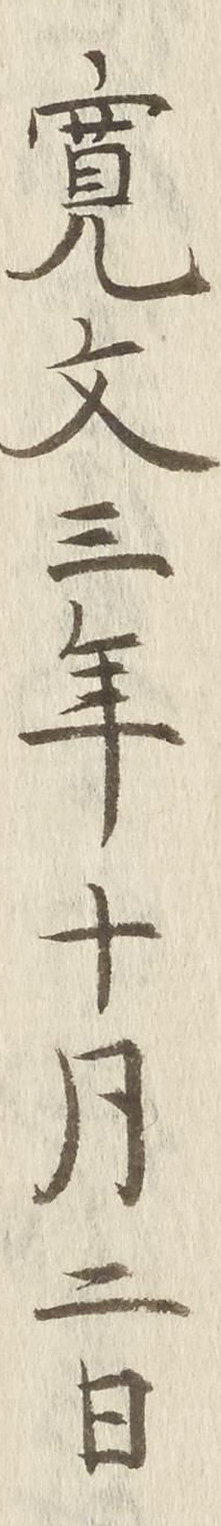寛文三年十月二日
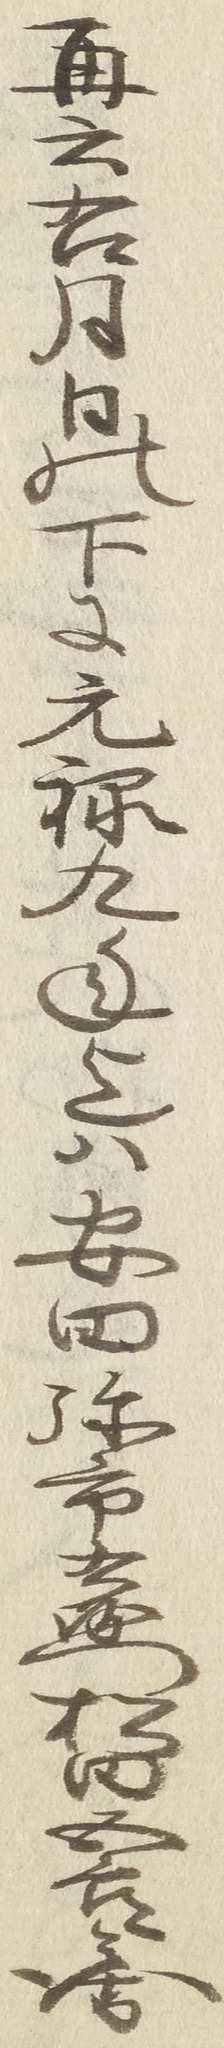再云右月日の下に元禄九年迄は安田弥市右衛門松田五郎兵衛
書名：地震記　上
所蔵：東京大学地震研究所図書室 Earthquake Research Institute Library, The University of Tokyo, JAPAN
